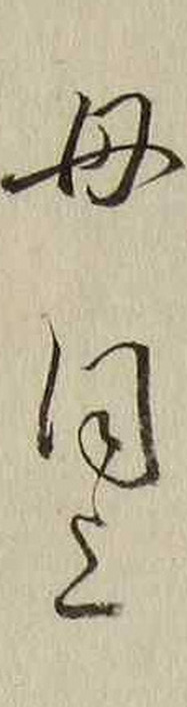母同上
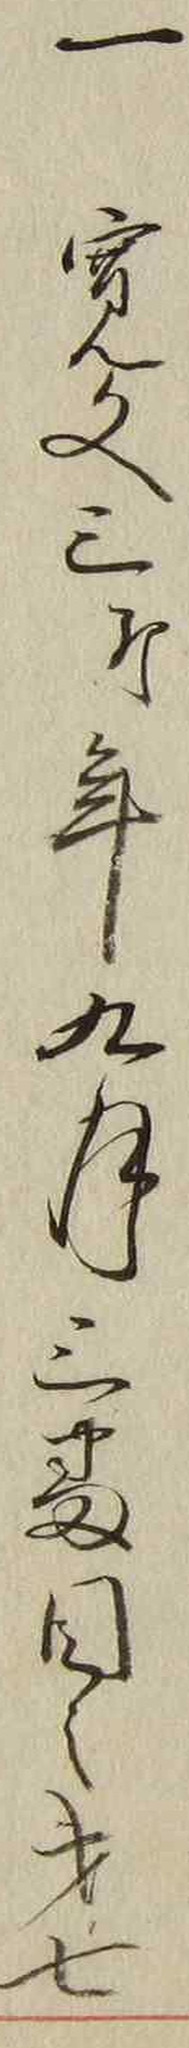一寛文三卯年九月三番目之弟七
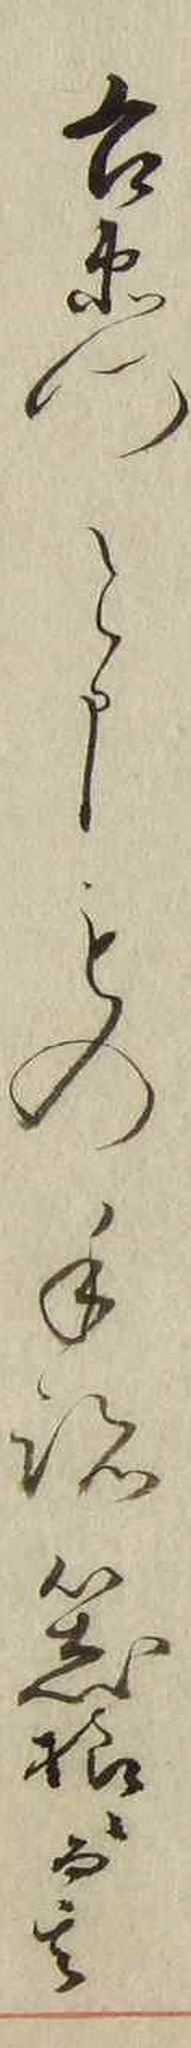右衛門と申もの手跡器様ニ而其

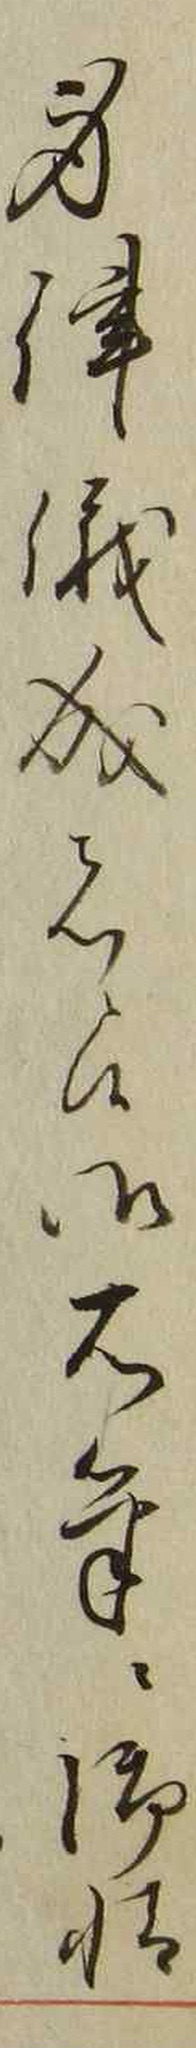身律儀成者ニ候御右筆ニ御情
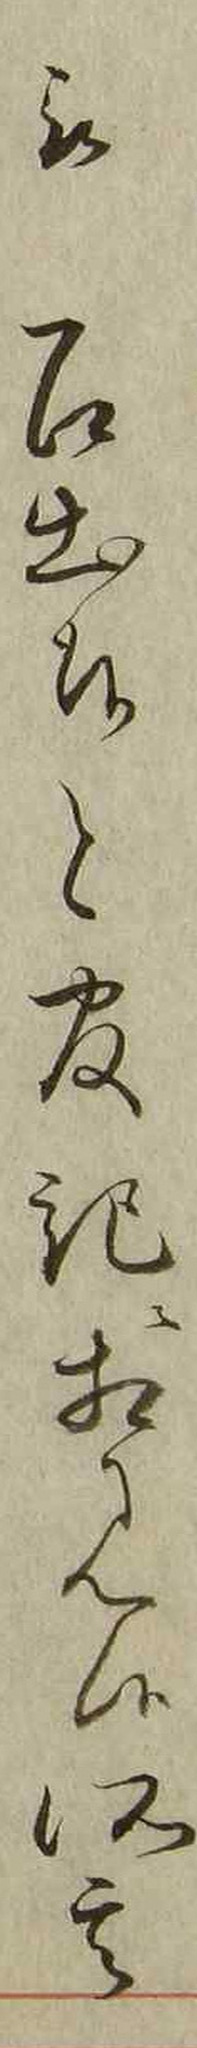被召出候と官記ニ相見候所其
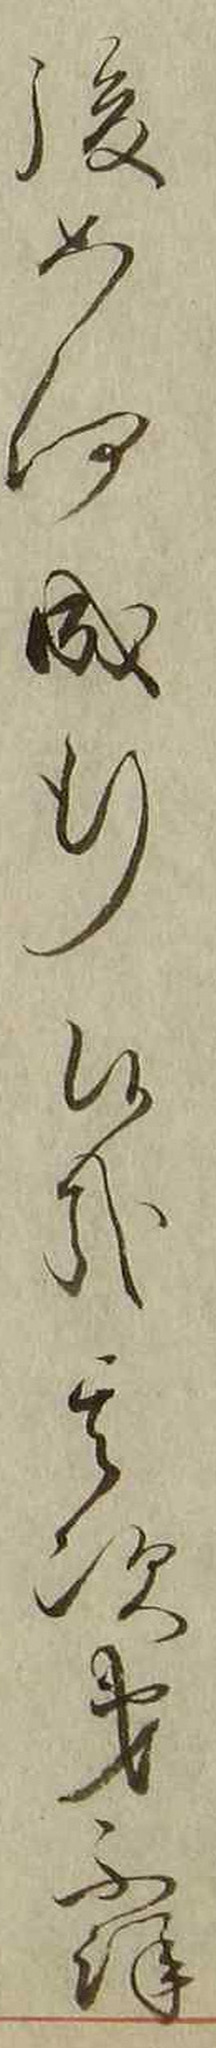後如何成行候哉其次第不詳
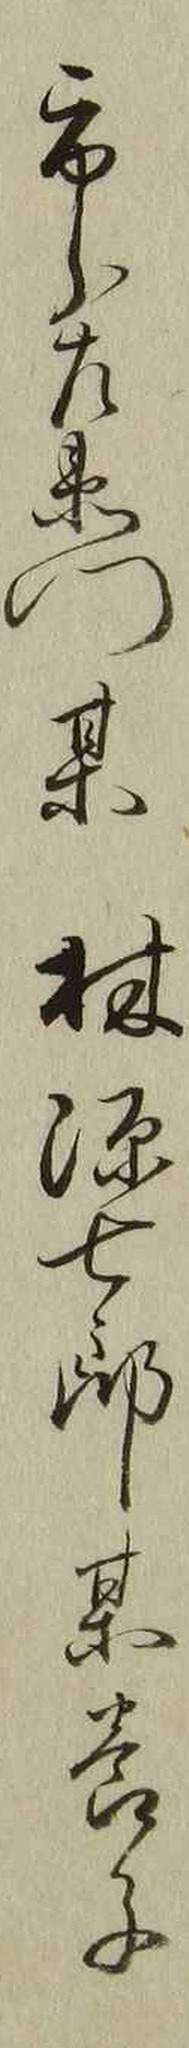市郎左衛門某林源七郎某養子
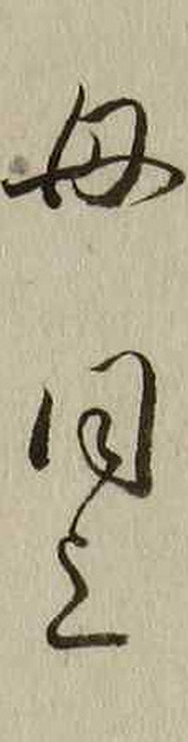母同上
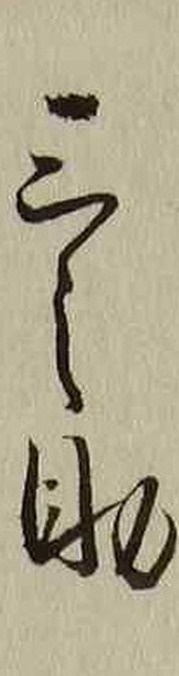三之助
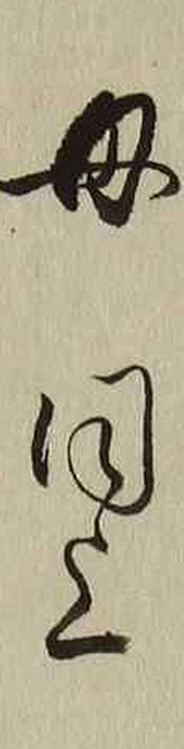母同上
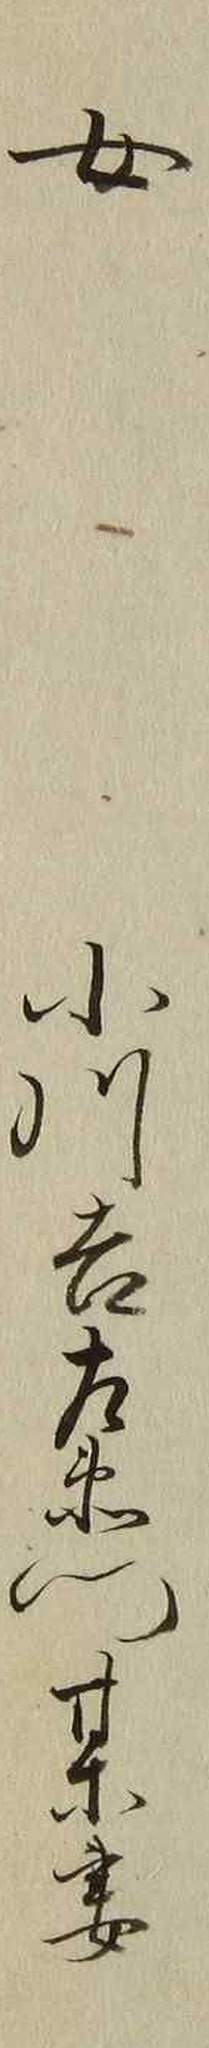女小川吉左衛門某妻
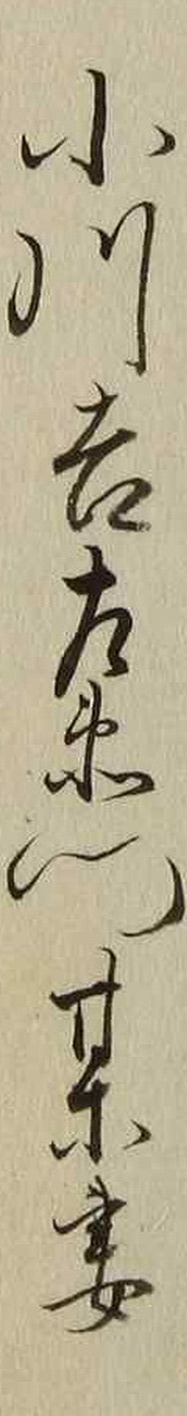女小川吉左衛門某妻
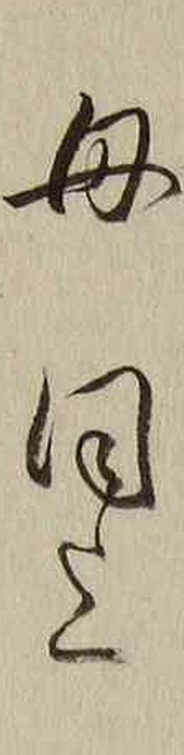母同上
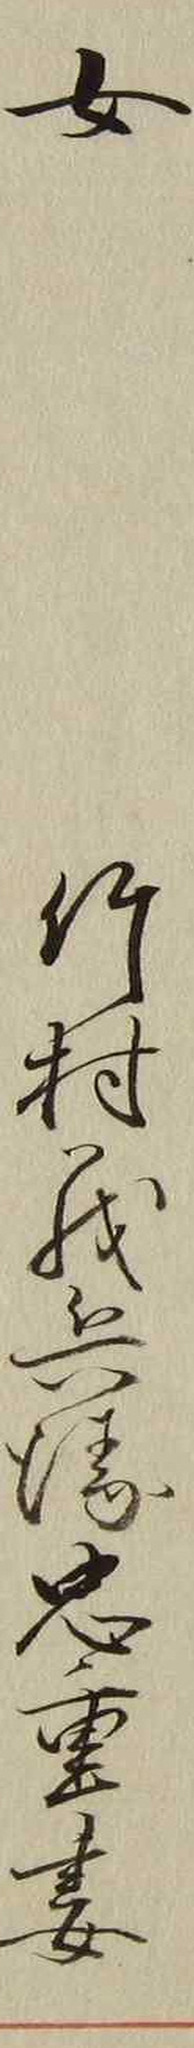女竹村茂兵衛忠重妻
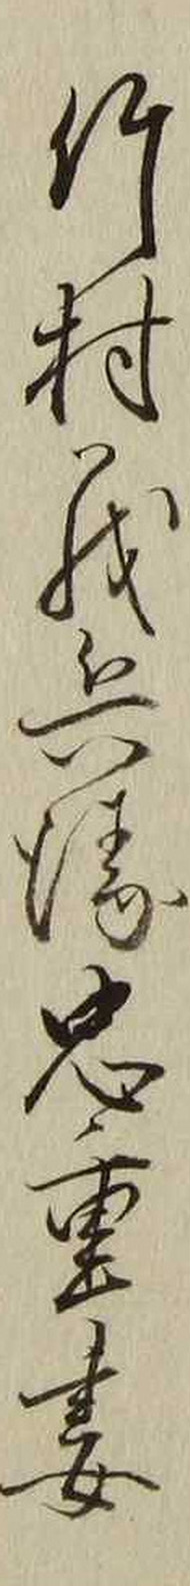女竹村茂兵衛忠重妻
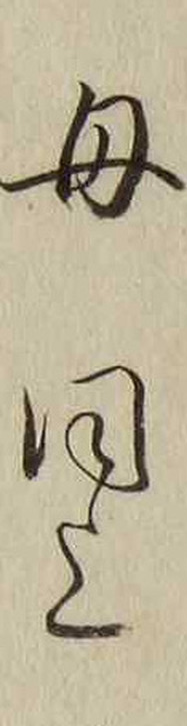母同上
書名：諸士系譜　巻之2　い之部2
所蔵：会津若松市立会津図書館
